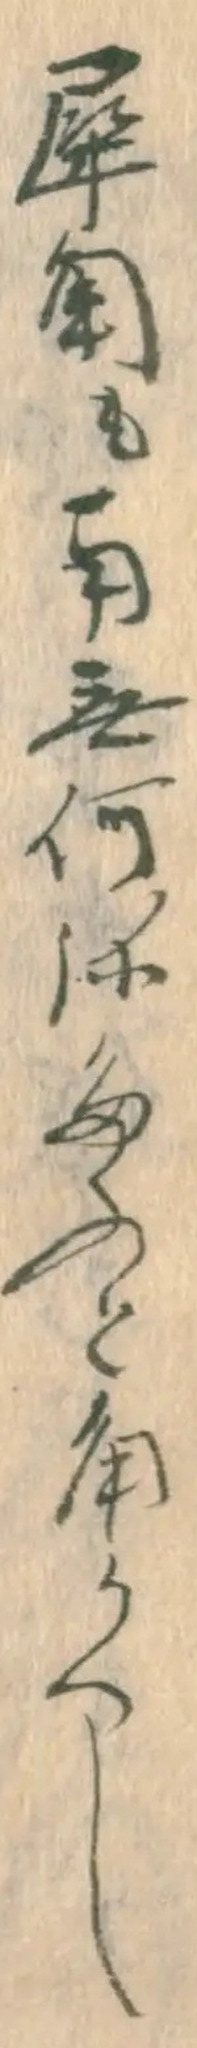犀角も南無阿弥たふと角かへし
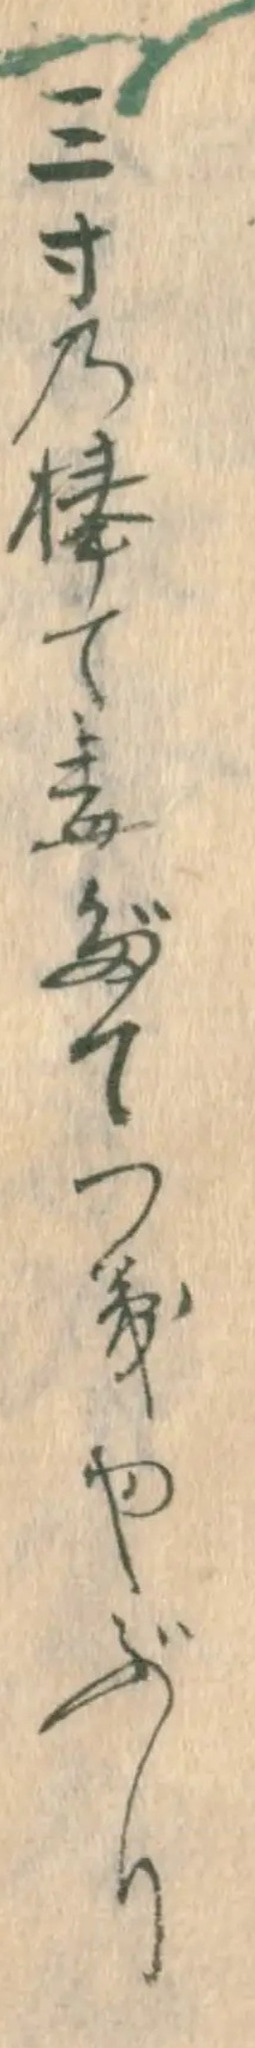三寸乃棒て毒だてつきやぶり
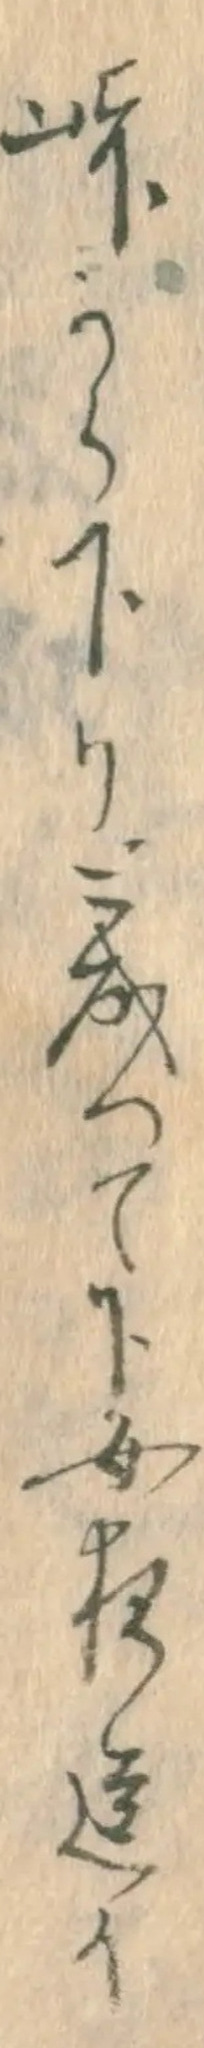峠から下りに成って下女夜這イ
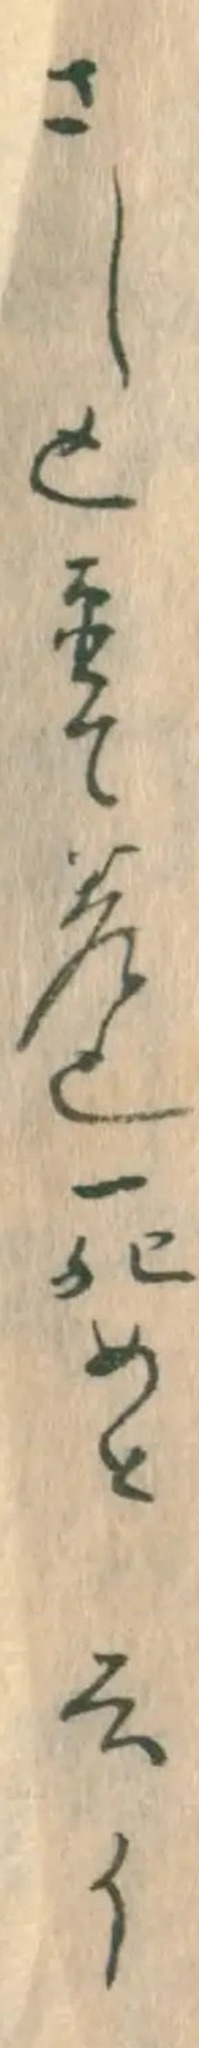さし込置て差込死めと云イ

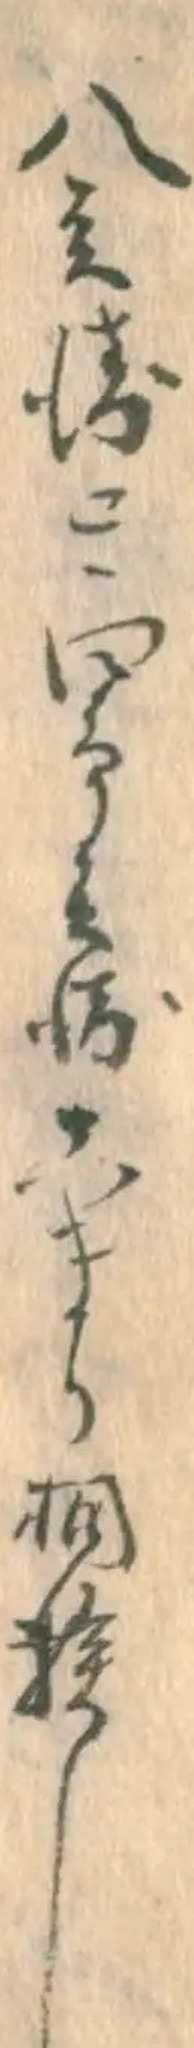八兵衛と四郎兵衛こまり相談し
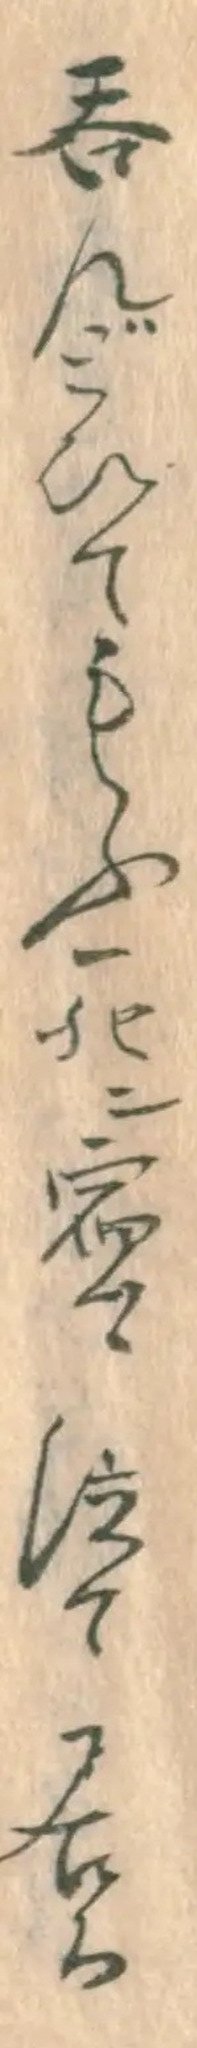呑んどひてもふ死ン宿と泣て居る
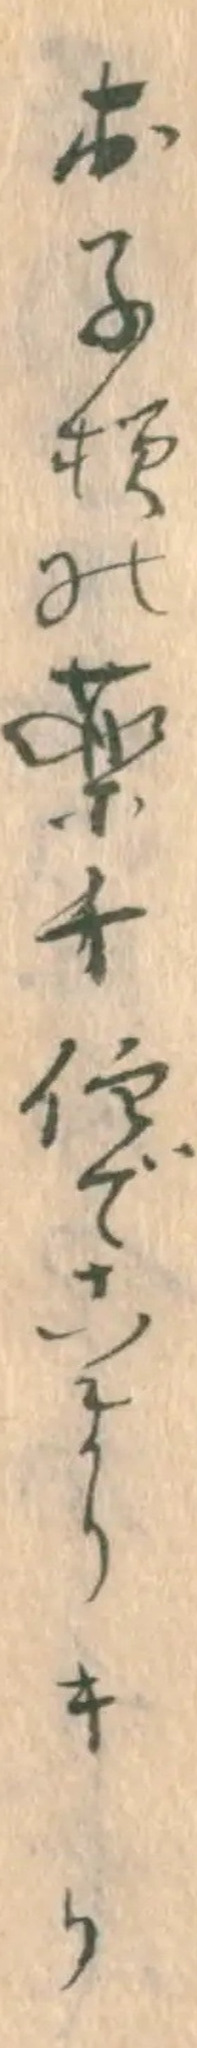お子種の薬千住でこまりきり
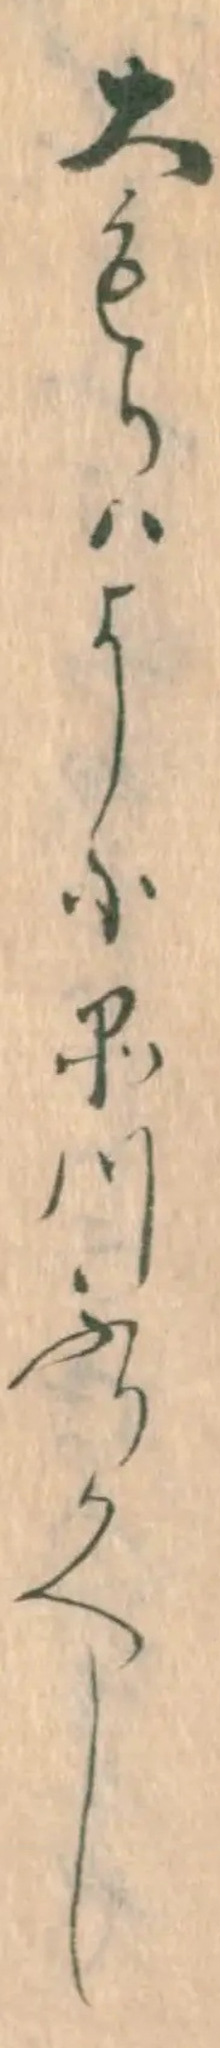大もりはよしに品川ふりかへし
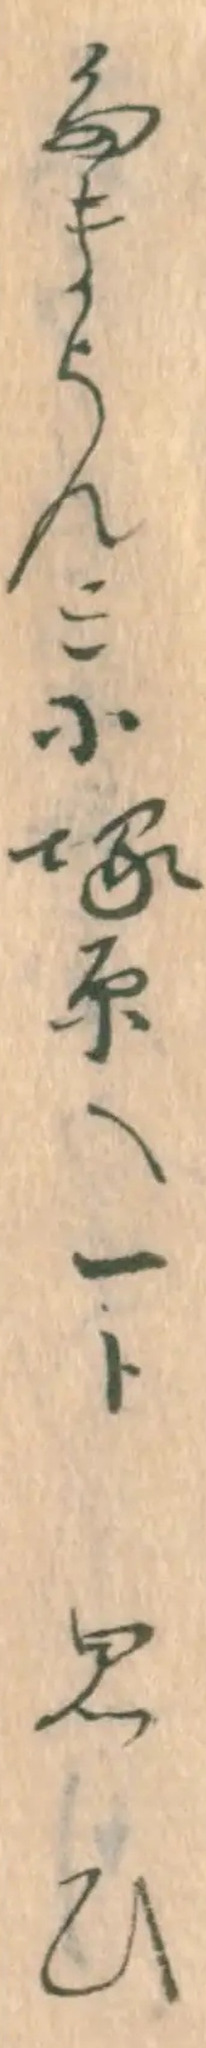たまらんと小塚原へ一ㇳ思ひ
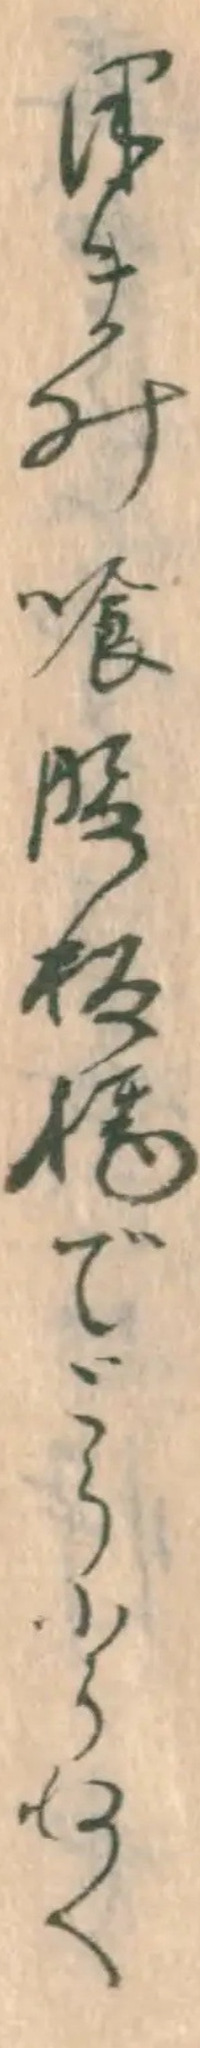つまみ喰腹板橋でとうとうねへ
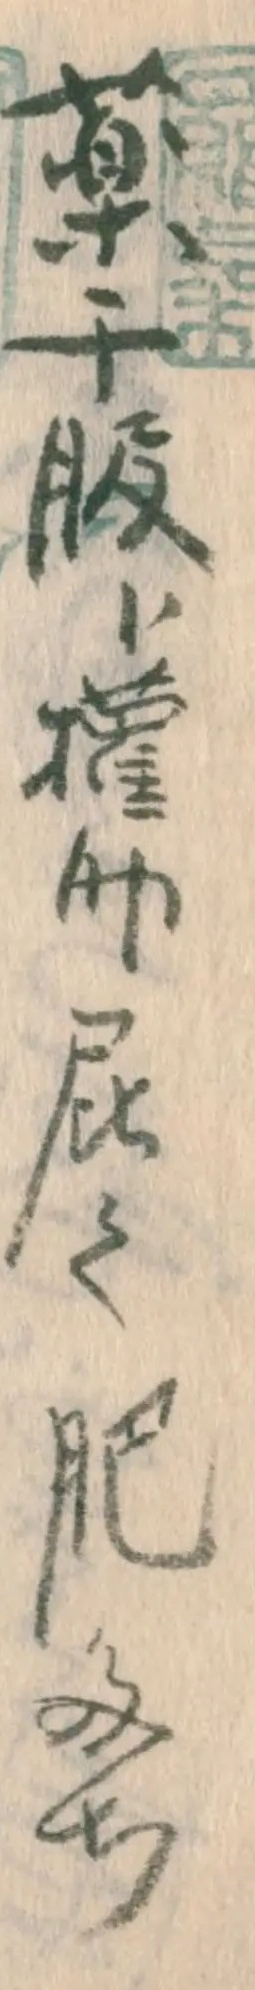薬千服ト権助屁で肥たち
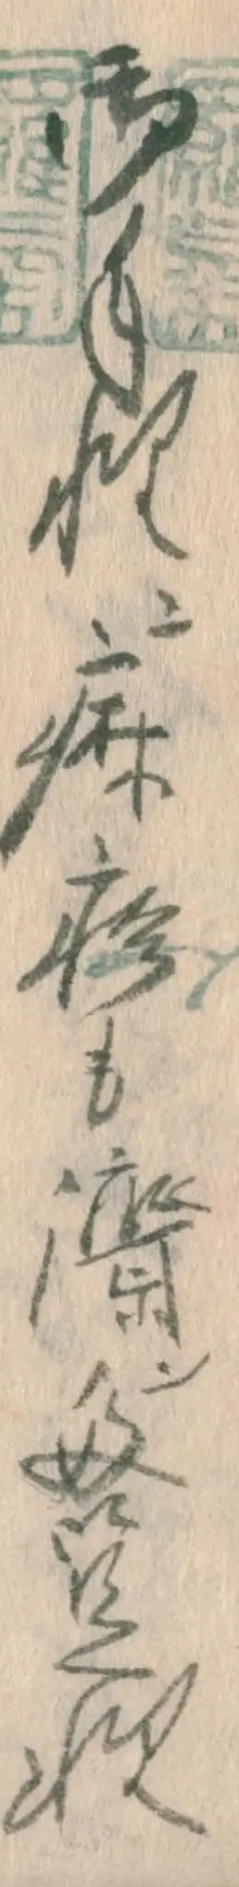御手軽に麻疹も済んだ御足軽
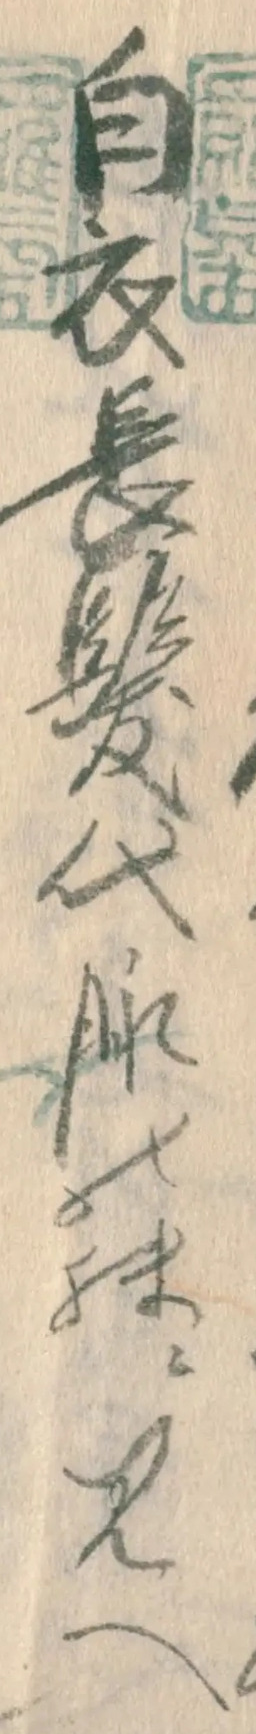白衣長髪代脈の様に見へ
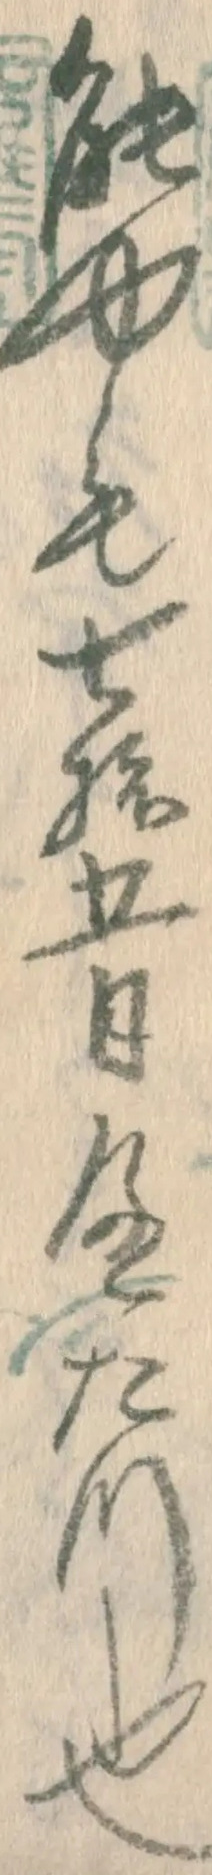能中も七十五日へたつ也
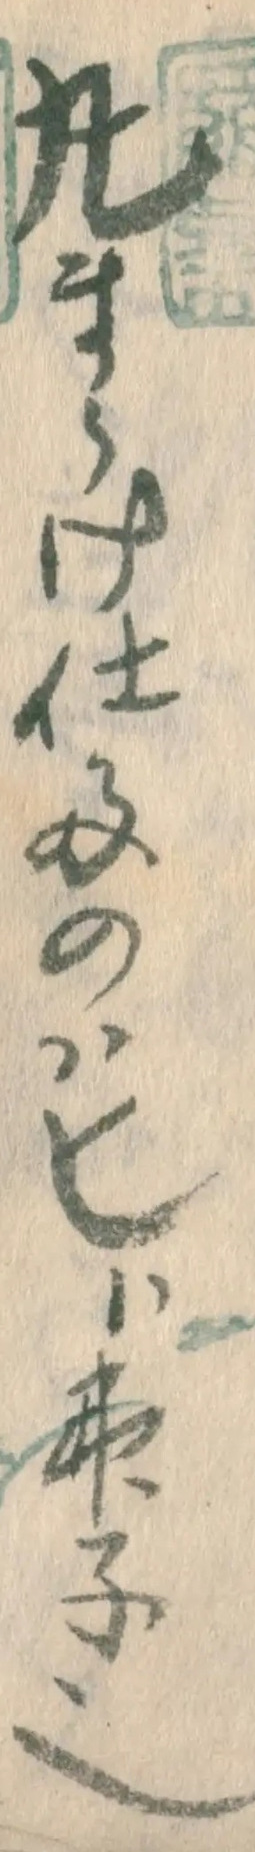丸まうけしたのは匕と仏子也

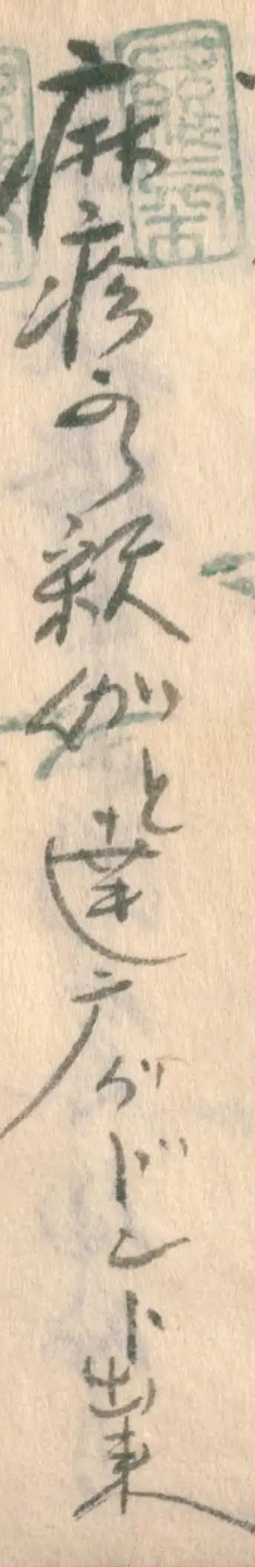麻疹から釈迦と達磨がドント出来
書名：麻疹後柳樽
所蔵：国立国会図書館 National Diet Library, JAPAN
